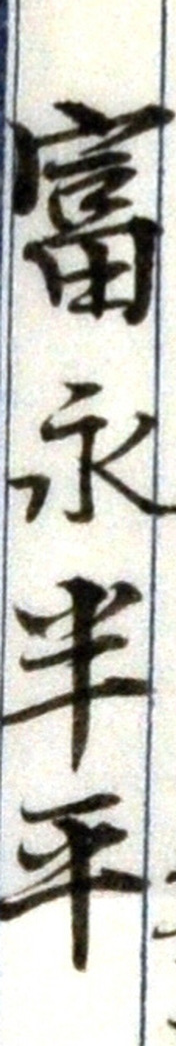富永半平
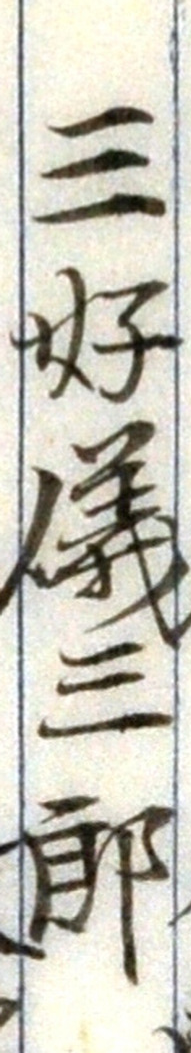三好儀三郎
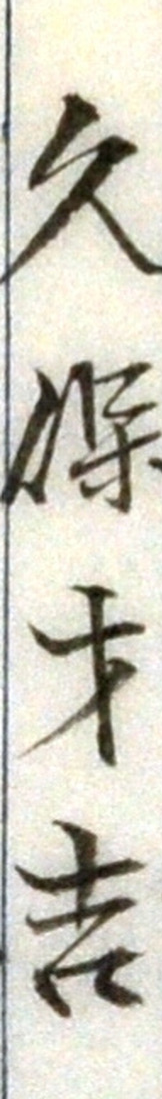久保才吉
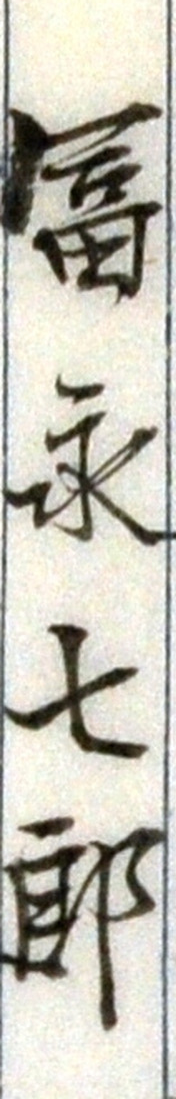冨永七郎
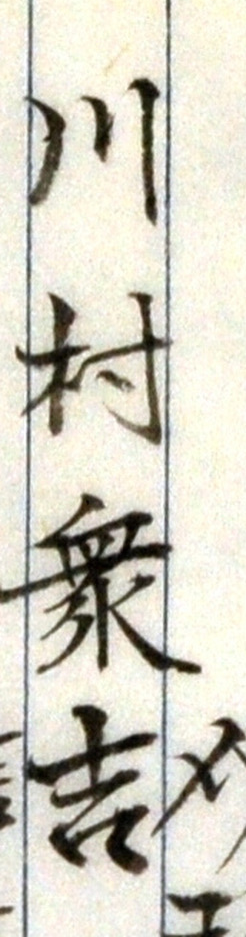川村衆吉
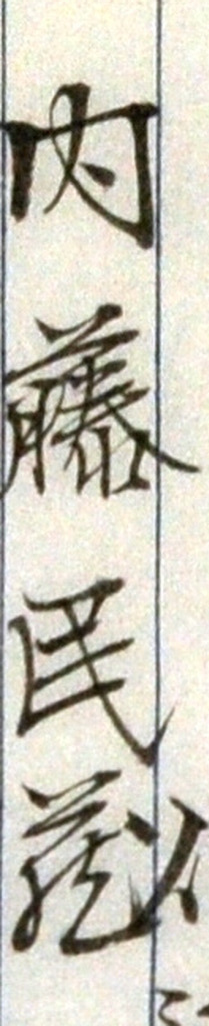内藤民蔵
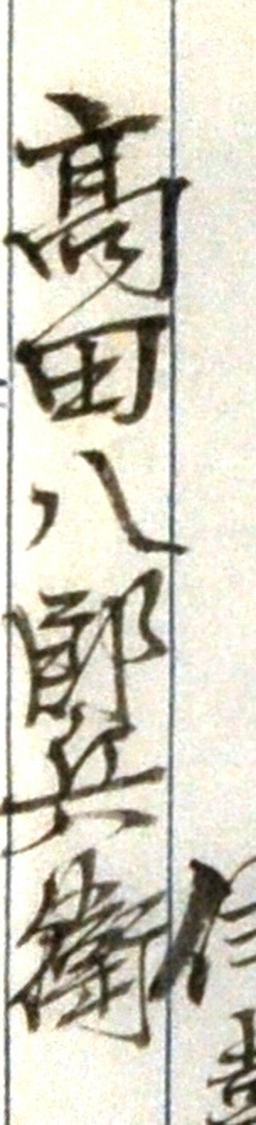高田八郎兵衛

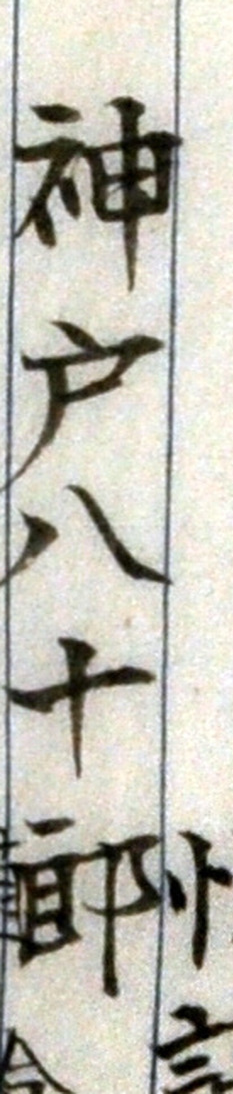神戸八十郎
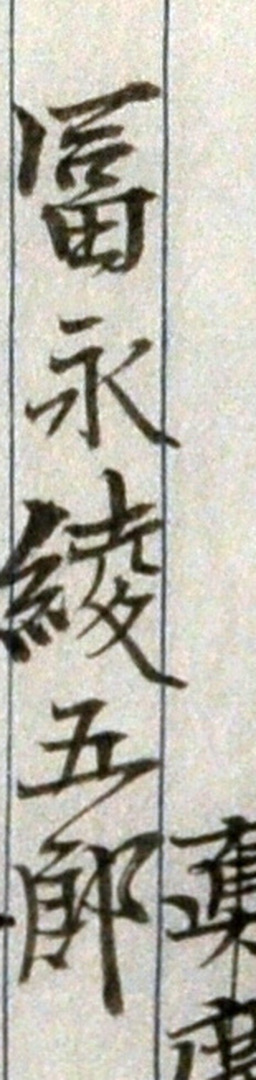冨永綾五郎
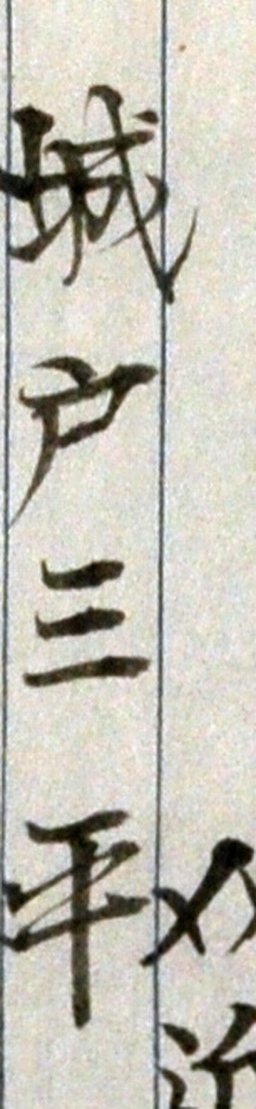城戸三平
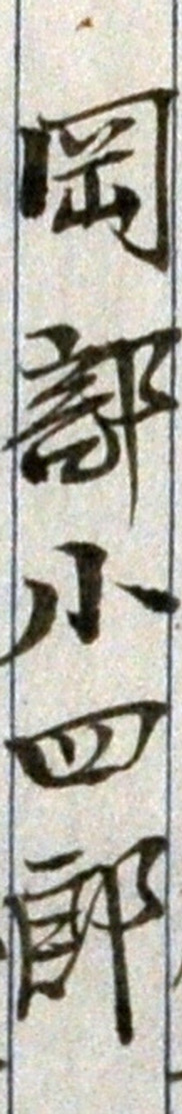岡部小四郎
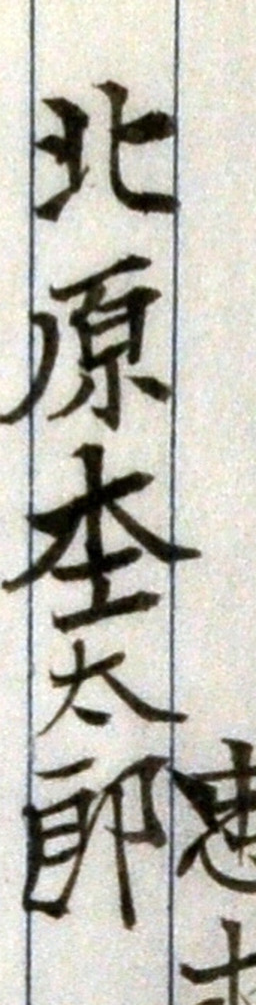北原杢太郎
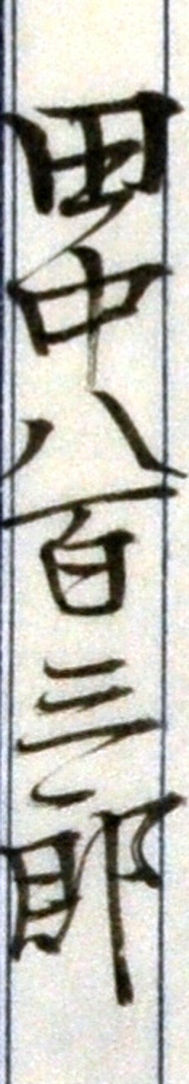田中八百三郎
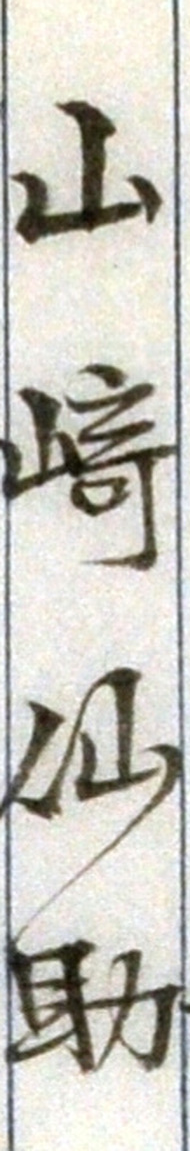山崎仙助
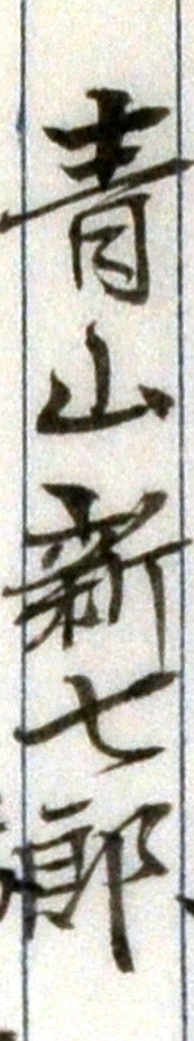青山新七郎
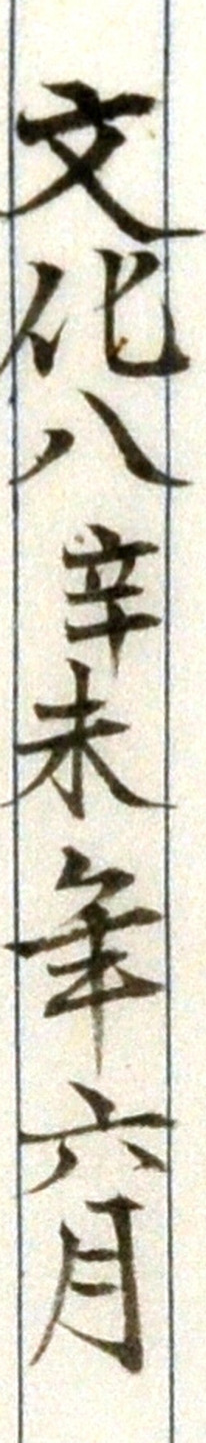文化八辛未年六月
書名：竹内流・甲州流・荒木流・一刀流新当流起請文及免許写堤宝山流手鏡及個之大事
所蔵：伊那市立高遠町図書館・合同会社AMANE
